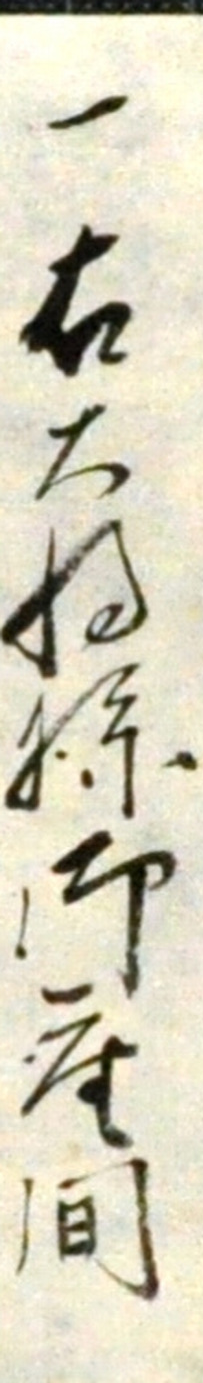一右大将様御座間
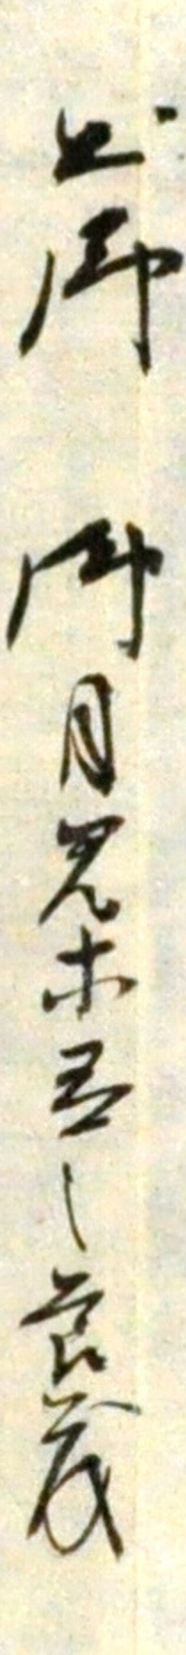出御御目見等有之節も
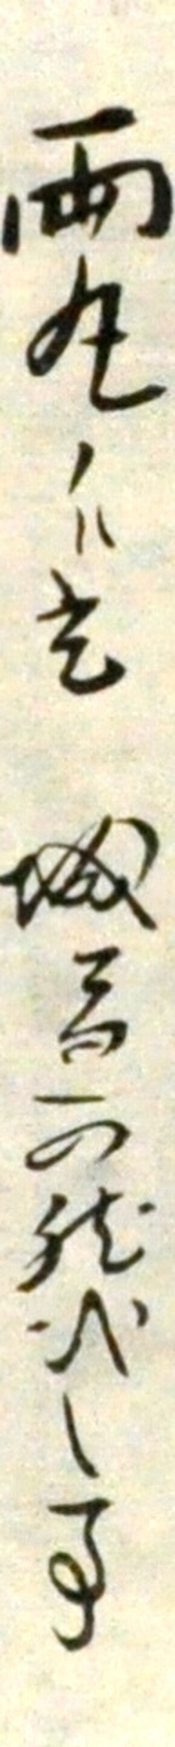両丸江登城ニ而可然哉之事
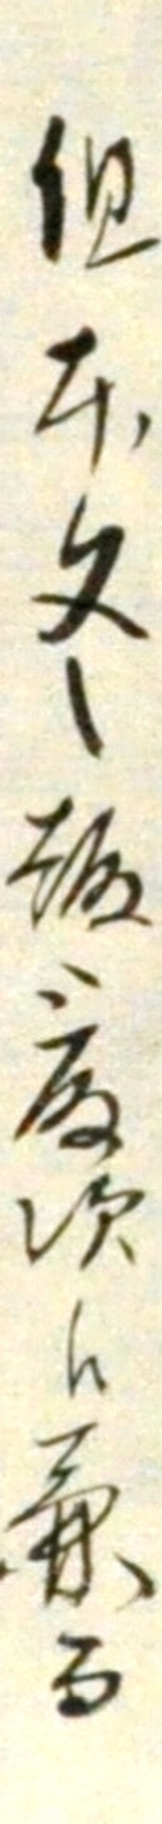但、本文之趣ハ取次江兼而
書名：（覚）
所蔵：伊那市立高遠町図書館・合同会社AMANE
